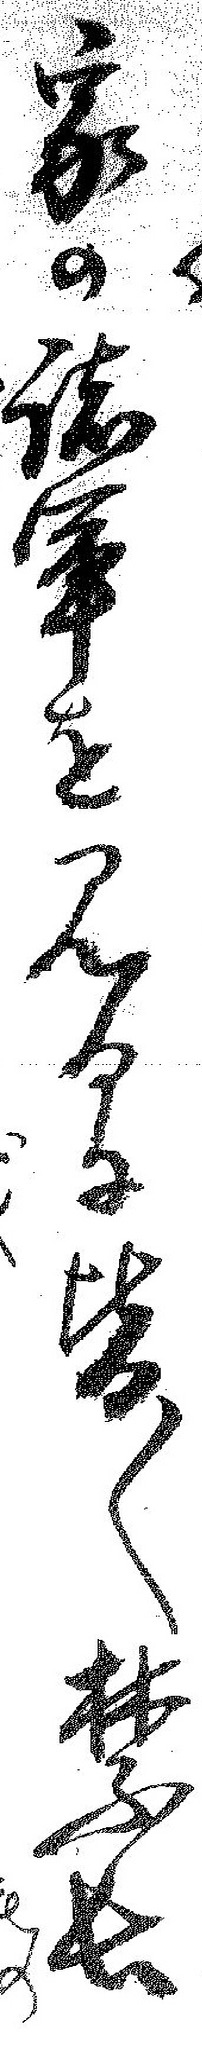家の諸軍を見るに皆〳〵禁長
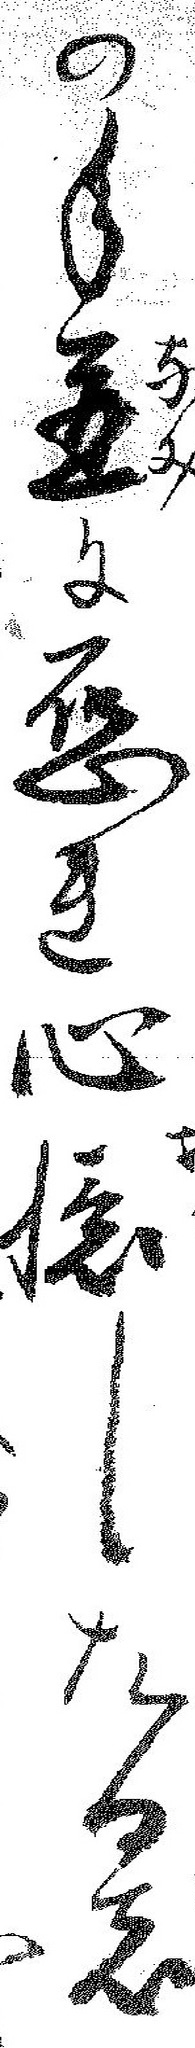の手並に恐れ心臆したる者
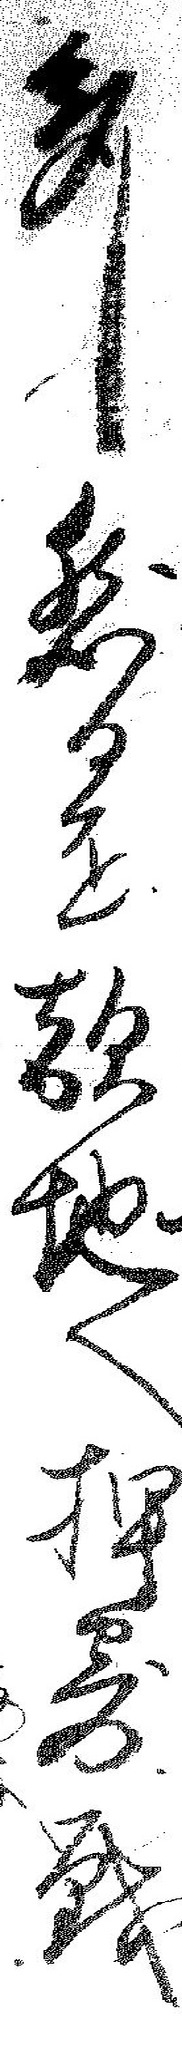多し然るを敵地へ押寄戦
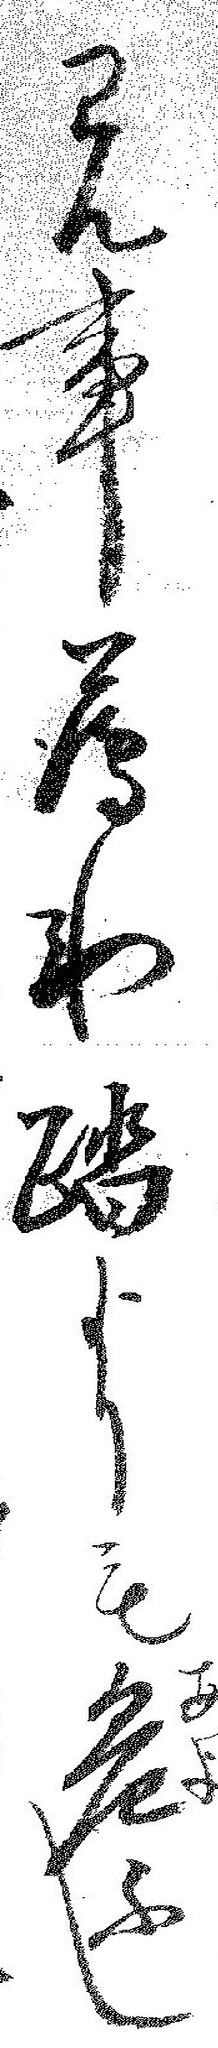わん事薄氷踏よりも危ふし
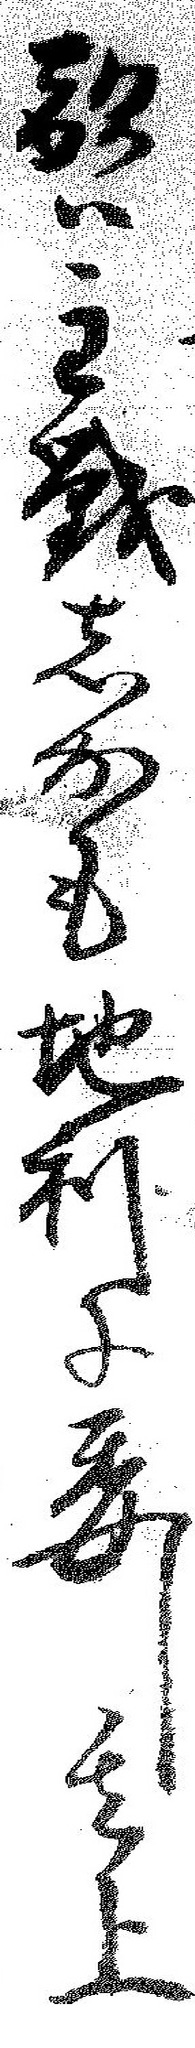敵は主戦しかも地利に委し其上
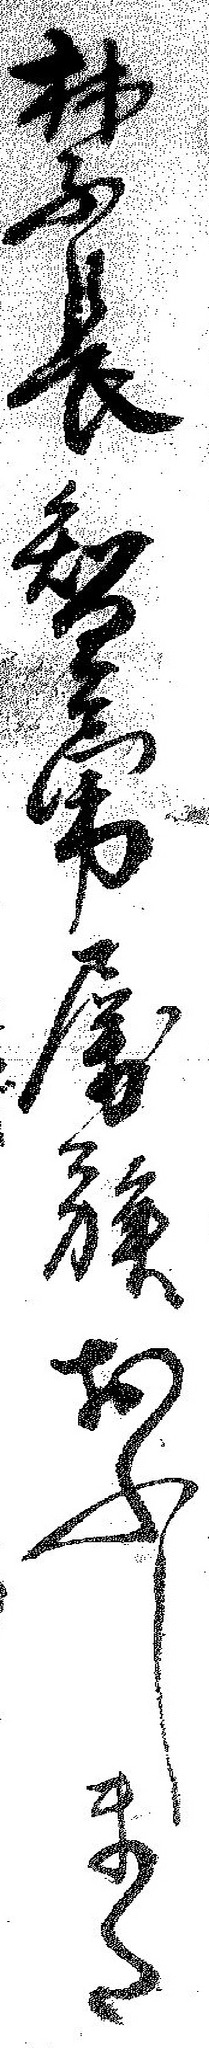禁長智勇属族おふしまた
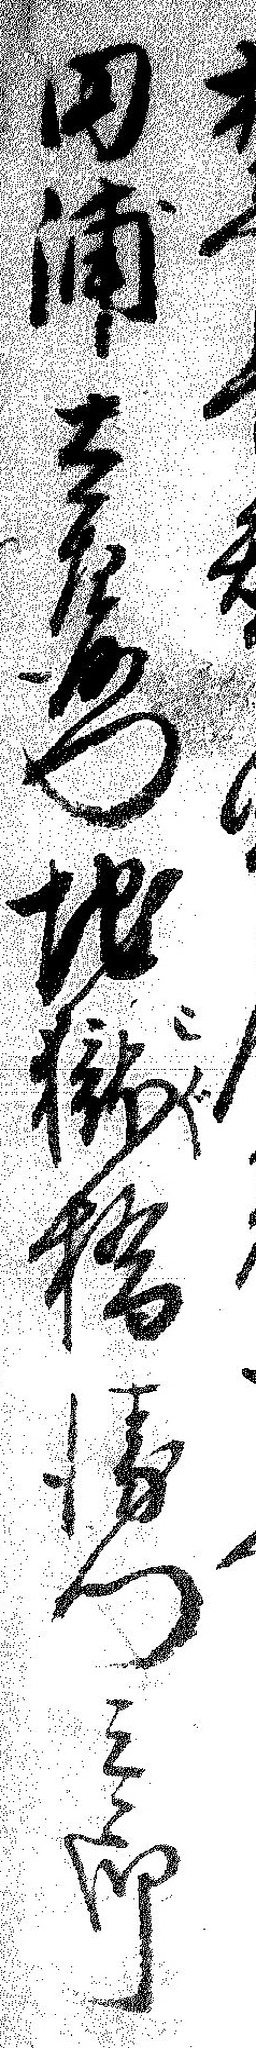田浦太左衛門地獄橋衛門三郎

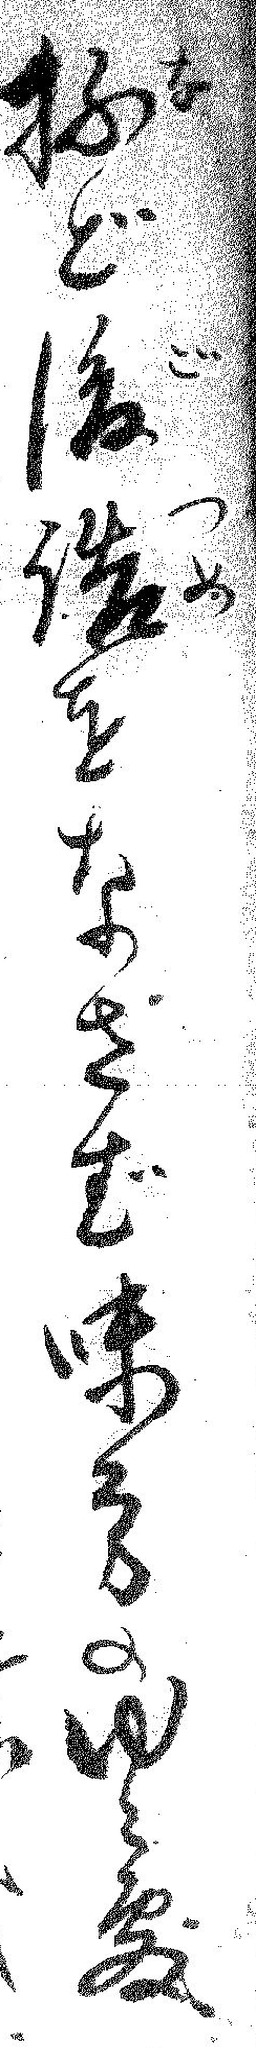抔ど後詰をなさば味方のゆゝ敷
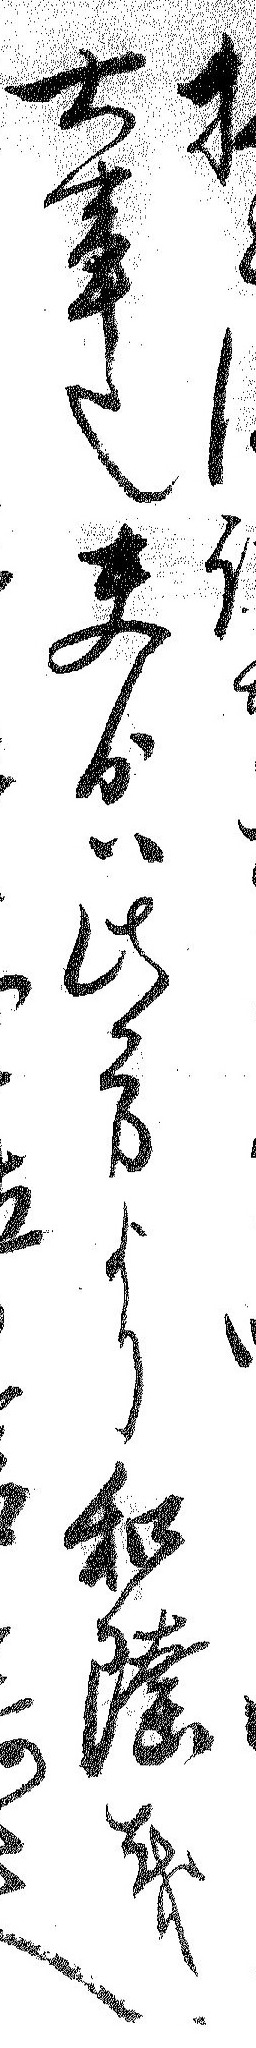大事也夫よりは此方より和陸を
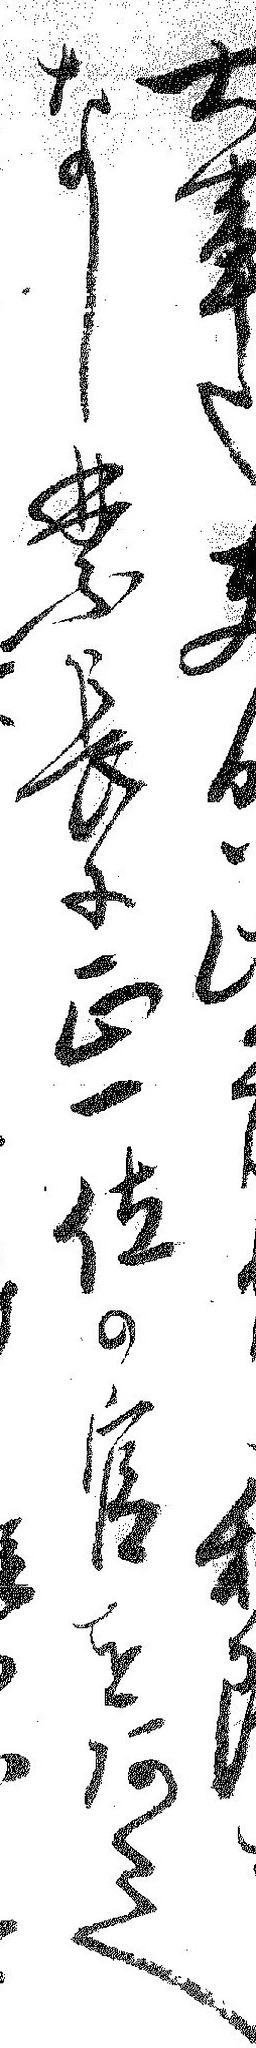なし禁長に正一位の官をあたへ
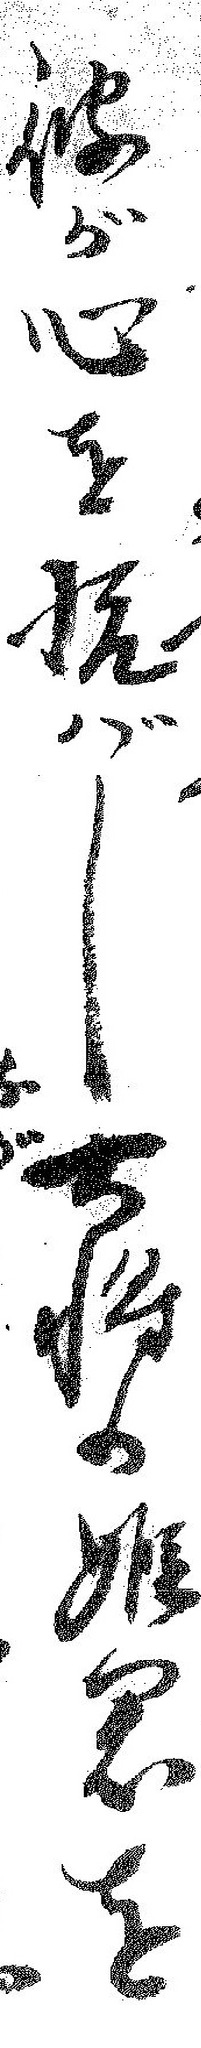彼が心を悦ばし大将の姫君を
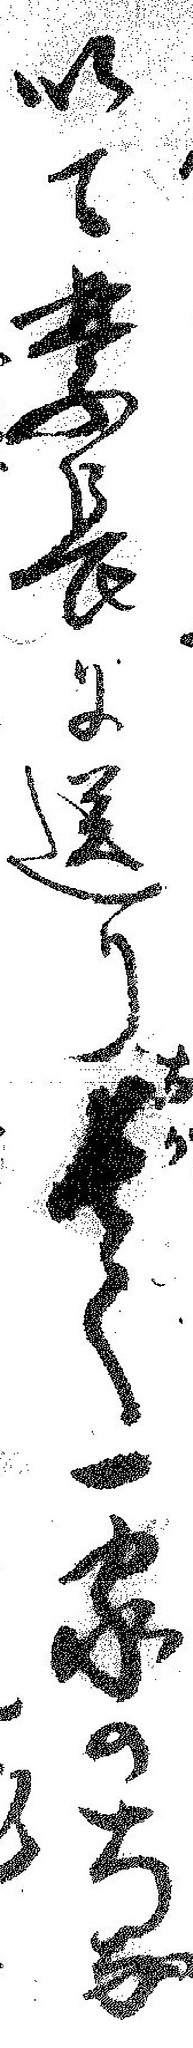以て禁長に送り長く一家のちな
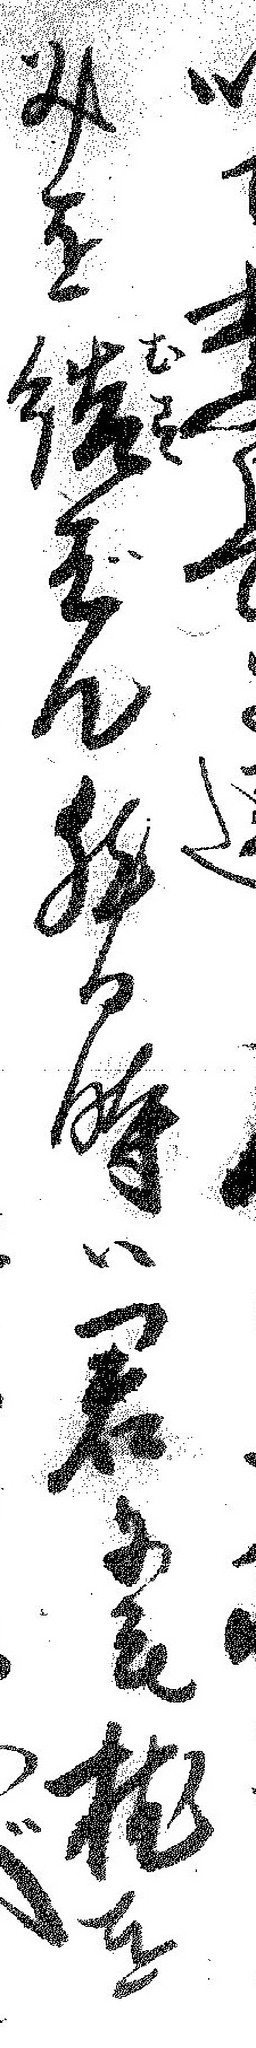みを結ばん然る時は君にも枕を
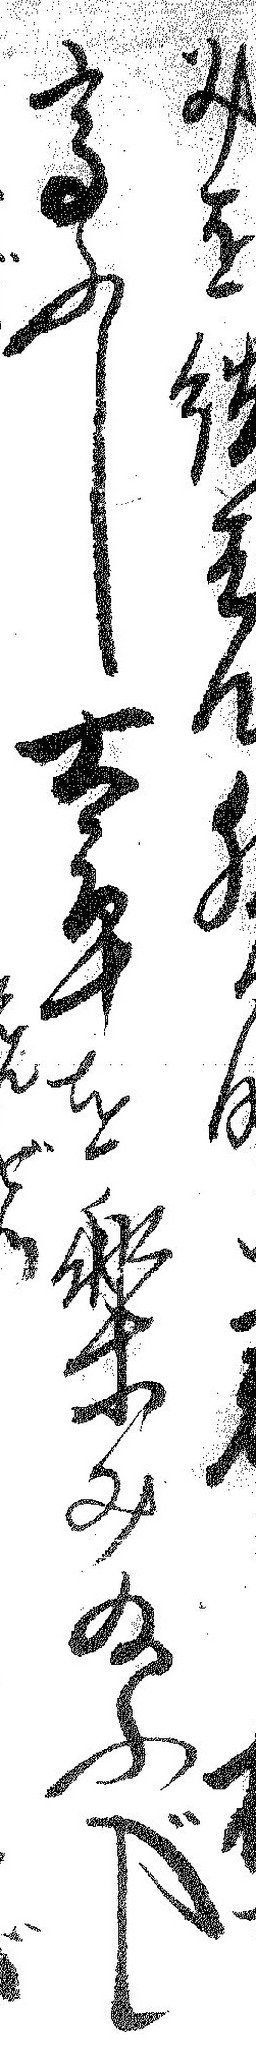高ふし太平を楽み給ふべし
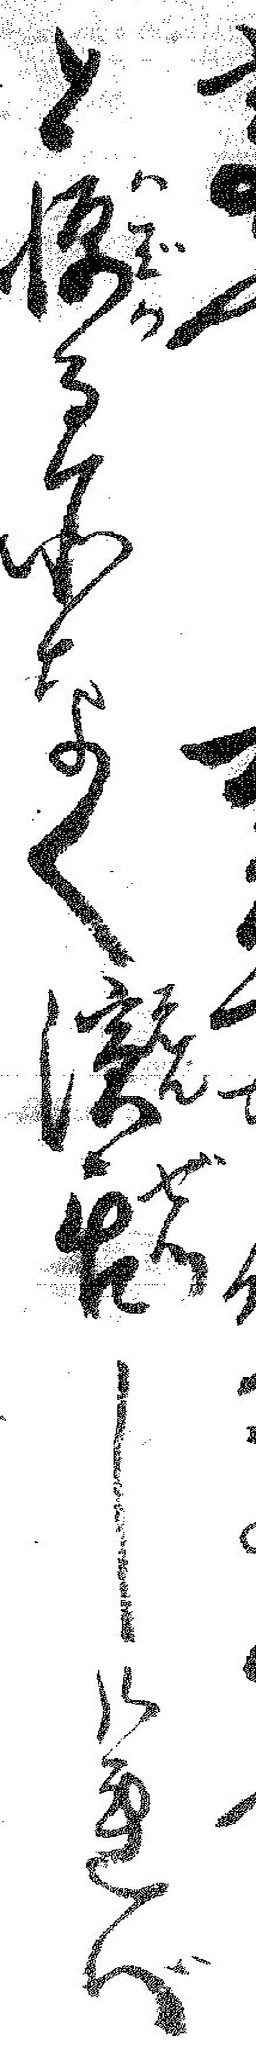と憚る所なく演舌しければ
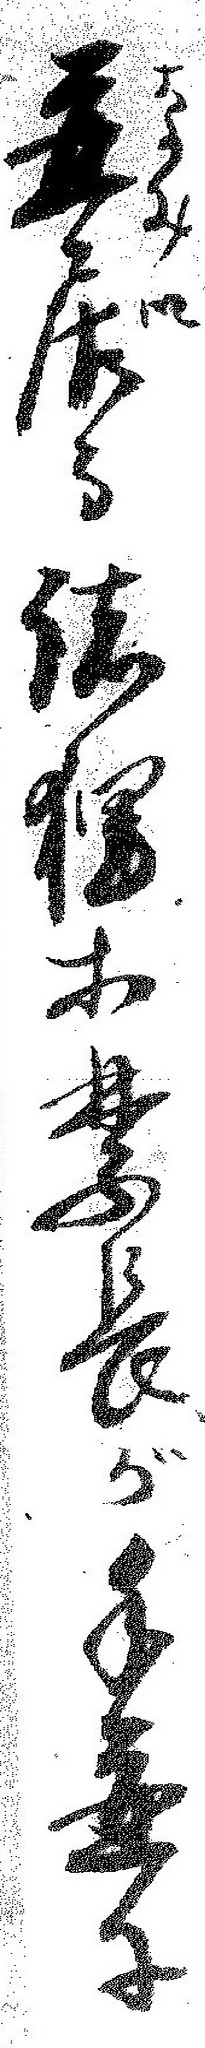並居る諸狸等禁長が手並に
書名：近頃古狸珍説　礼義智信
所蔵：徳島県立図書館
